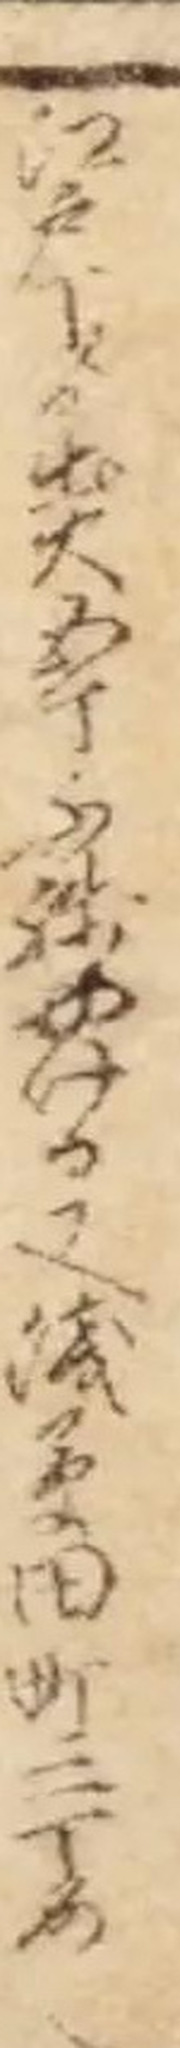江戸丁より出火五丁不残やける又浅草田町二丁目め
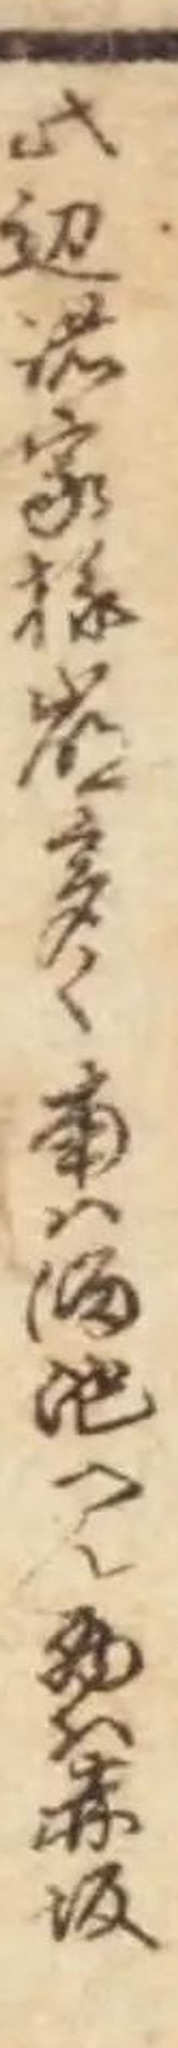此辺諸家様崩多く南は溜池へん西は赤坂
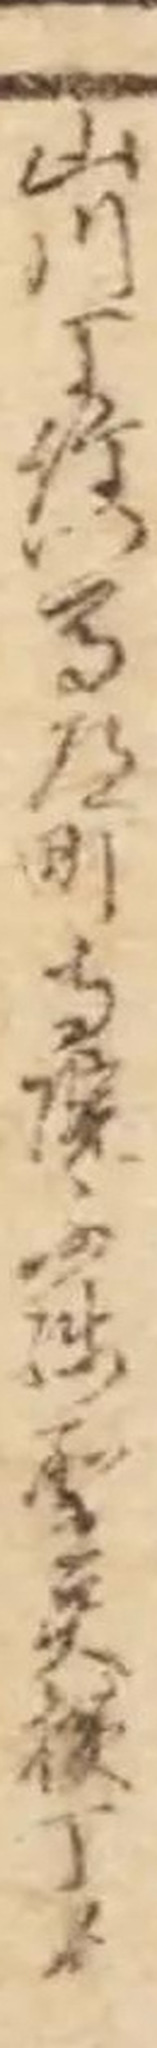山川丁竹門馬道町寺院不残聖天横丁より
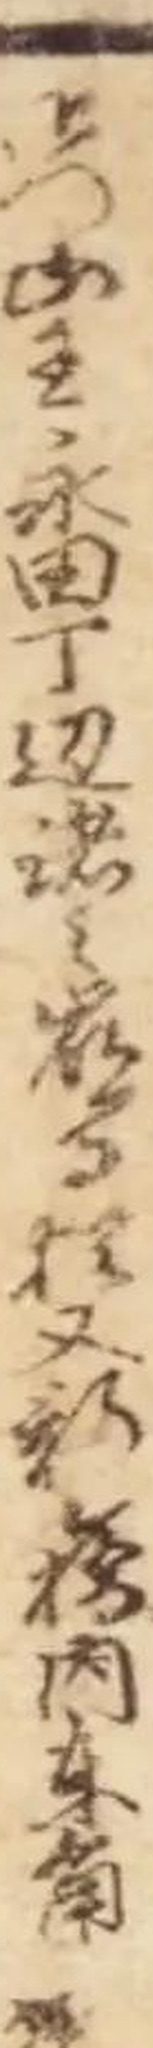御門山王永田丁辺諸〻崩る猶又新シ橋内東角
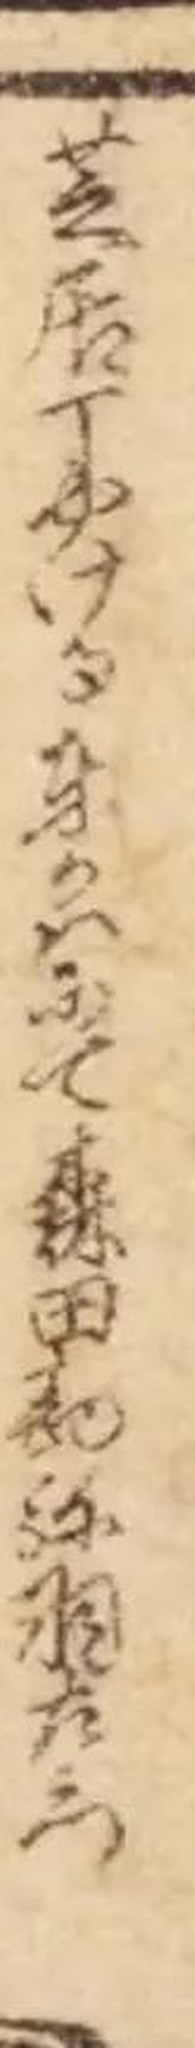芝居丁やける東かはにて森田勘弥羽左エ門
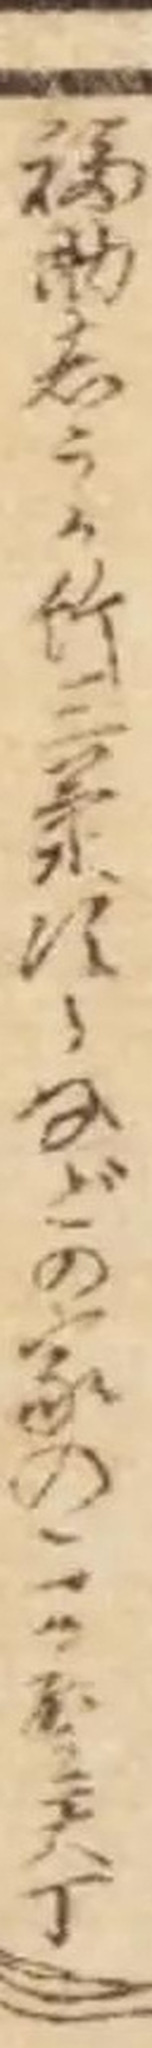福助しうか竹三茶すゝなどの家のこる聖天丁
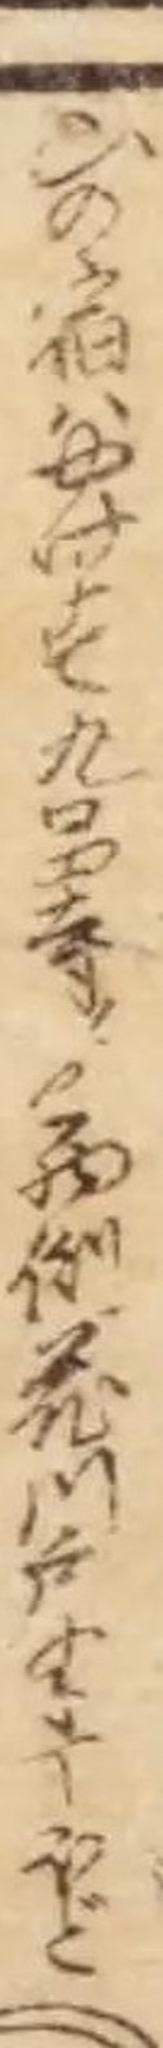山の宿はやけず九品寺より西側花川戸ほど
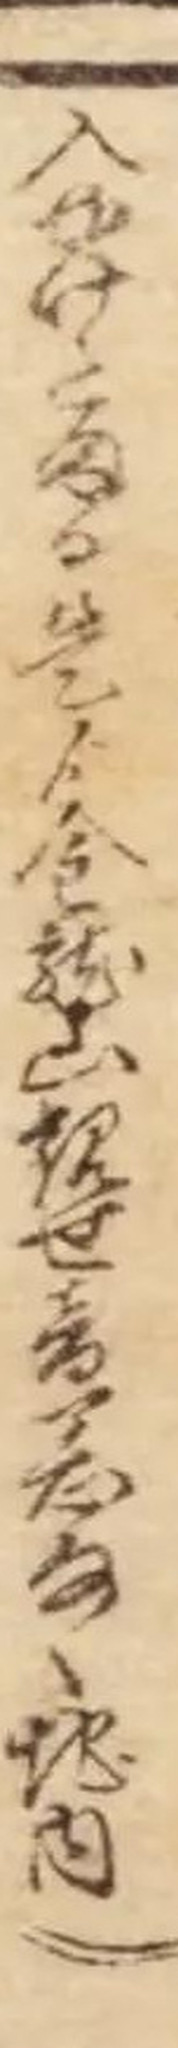入やけとまる是より金龍山観世音恙なく地内
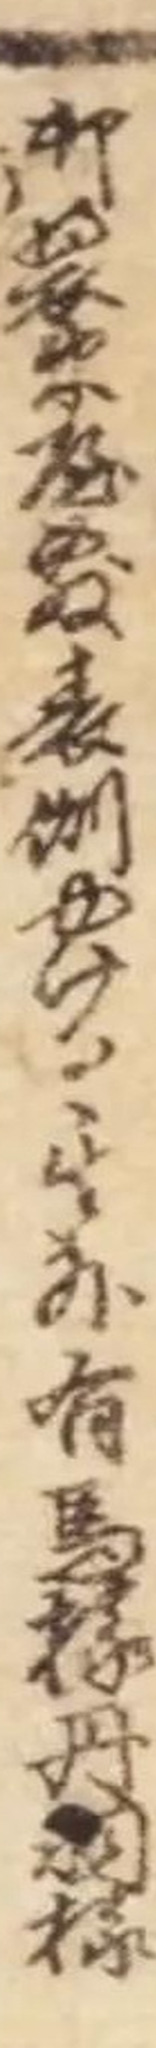御装束屋敷表側やける其外有馬様丹羽様
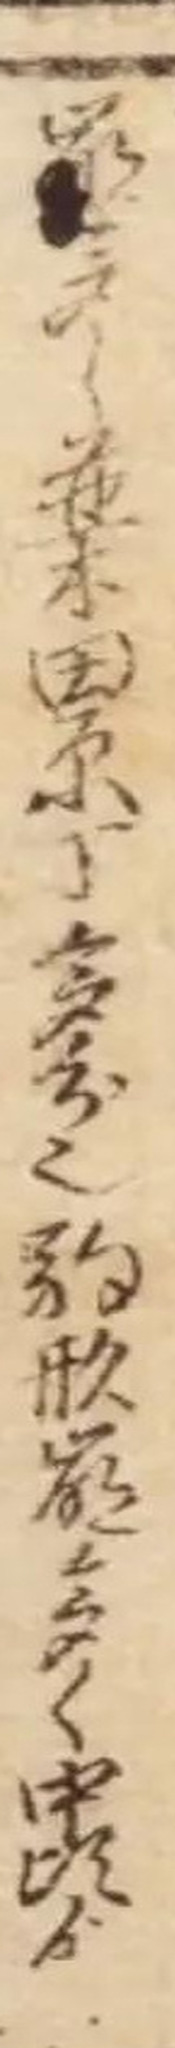崩れ多し並木田原丁多分也駒形崩多く中頃より
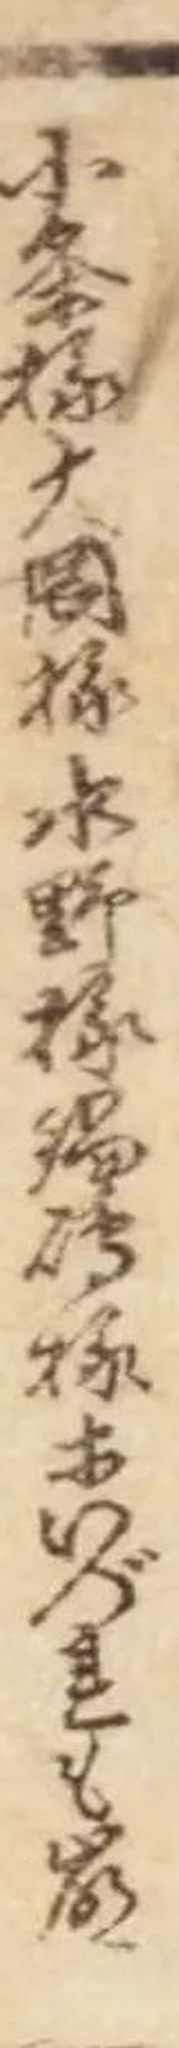に条様大岡様水野様鍋嶋様等いづれも崩
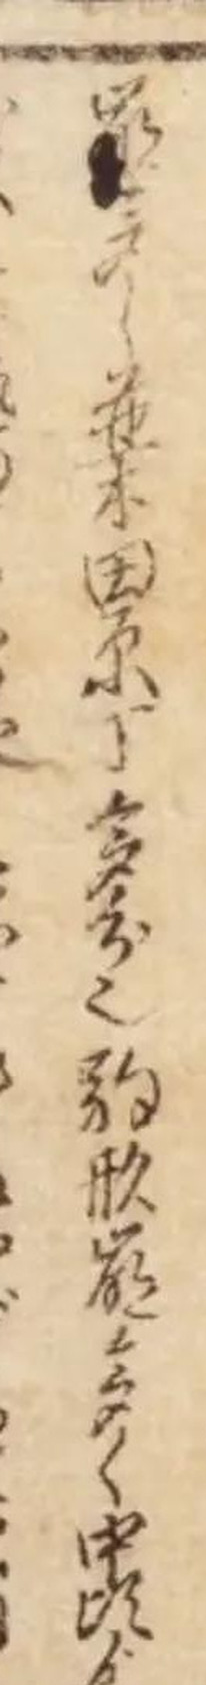崩れ多し並木田原丁多分也駒形崩多く中頃より
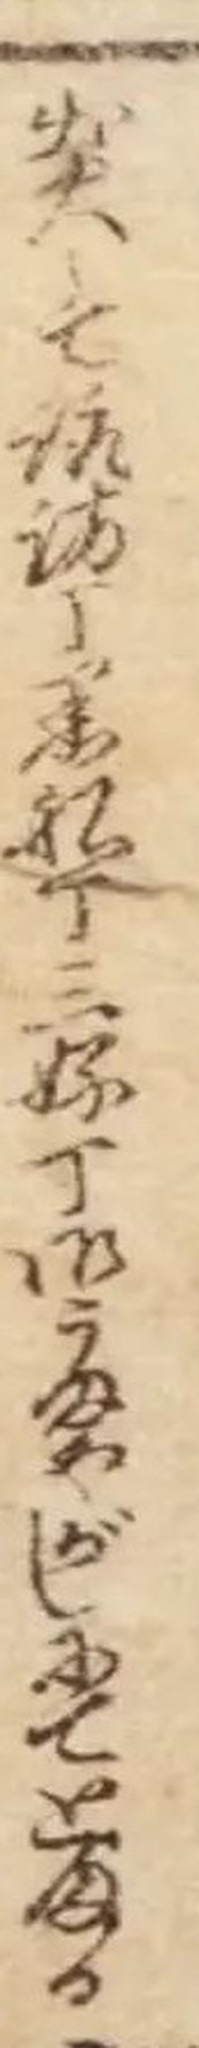出火して諏訪丁黒船丁三好丁御うまやがしにてとまる
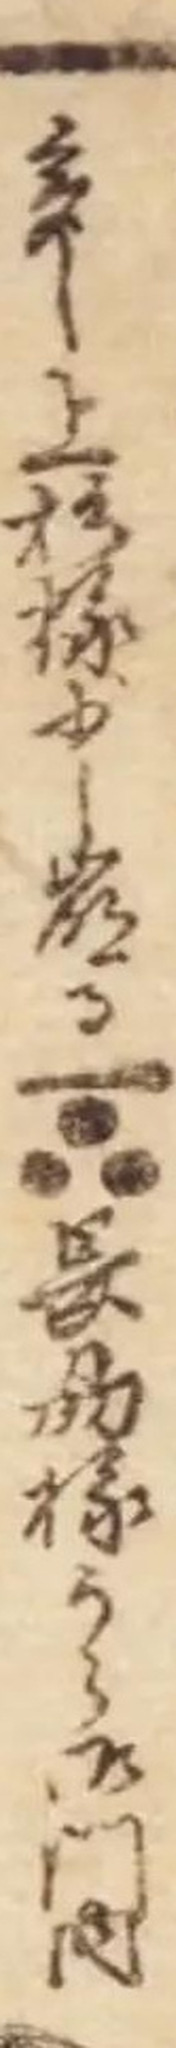多し上杉様少し崩る〇長州様うら御門内
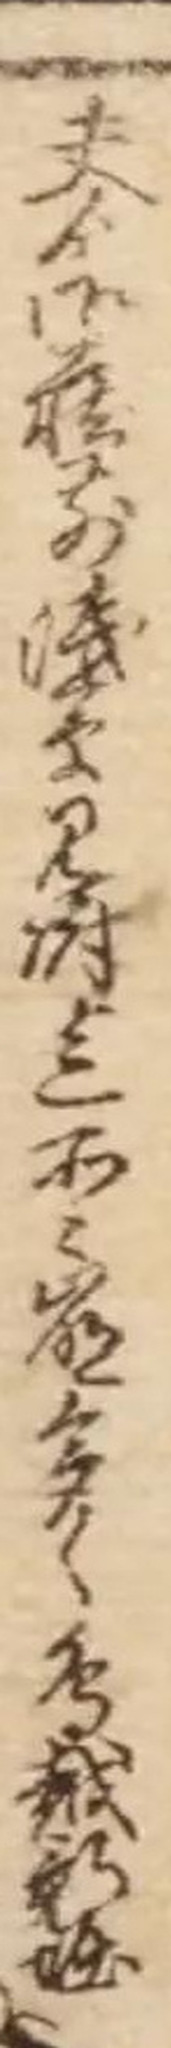夫より御蔵前浅草見附迄と所〻崩多く鳥越新堀
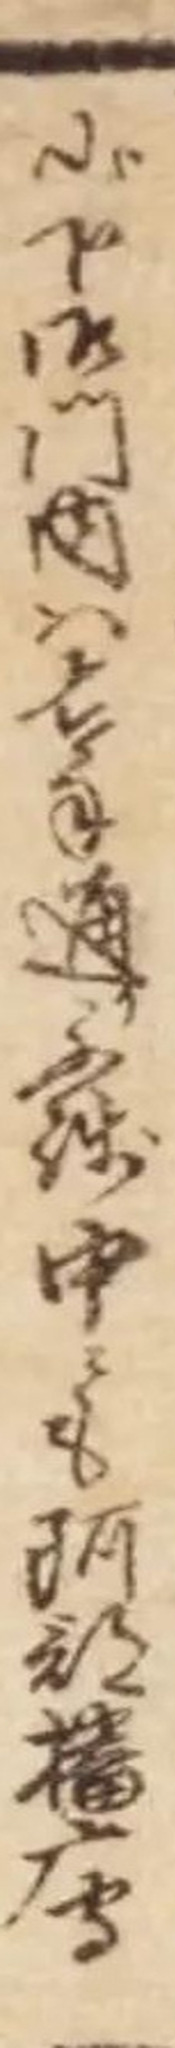山下御門内は手通りふ残中でも阿部播磨守
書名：御江戸関八州大地震出火巨細記
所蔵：国立国会図書館 National Diet Library, JAPAN
